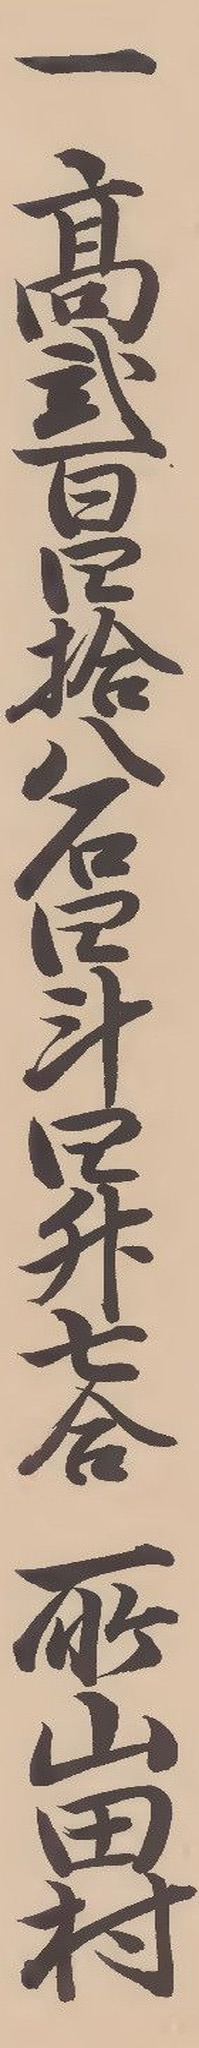一高弐百四拾八石四斗四升七合所山田村
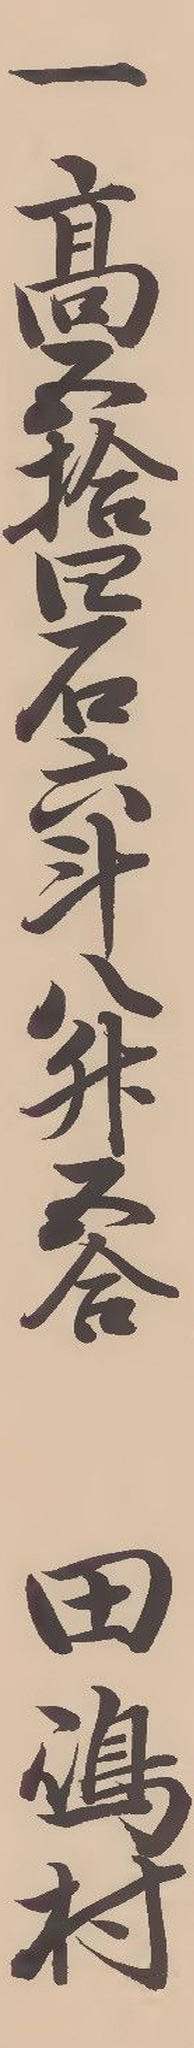一高五拾四石六斗八升五合田島村

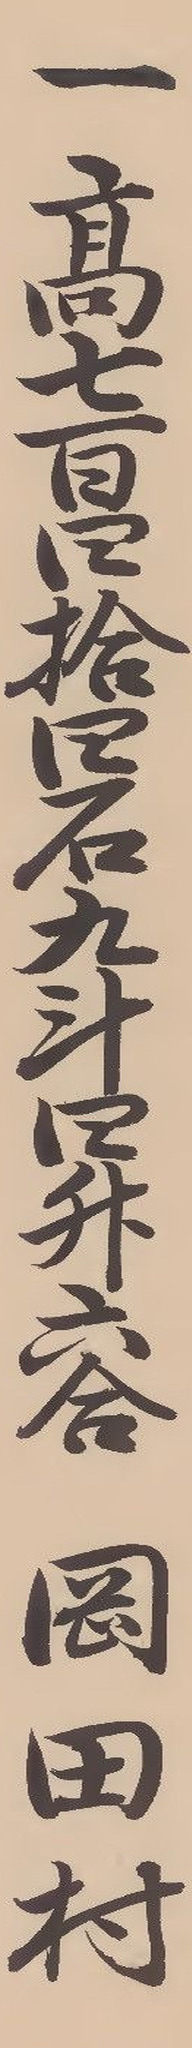一高七百四拾四石九斗四升六合岡田村
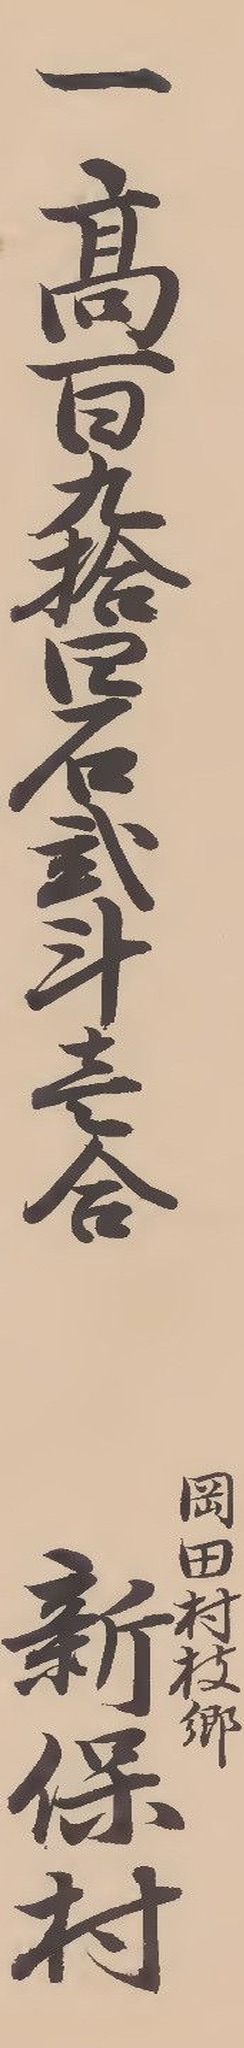一高百九拾四石弐斗壱合新保村
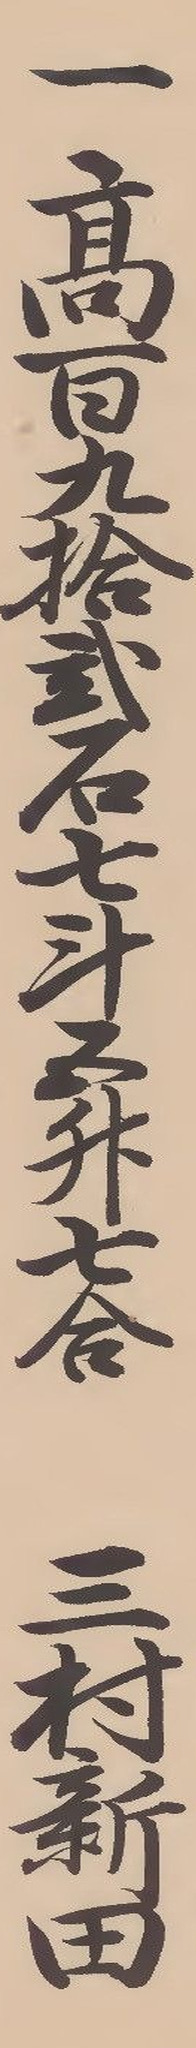一高百九拾弐石七斗五升七合三村新田
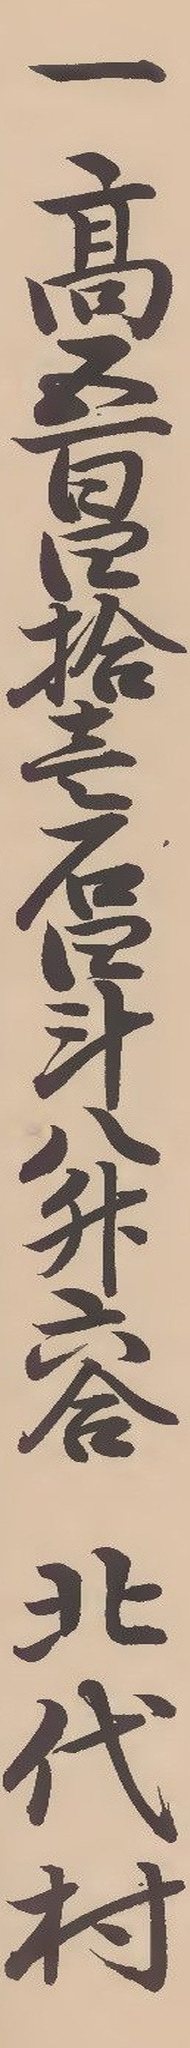一高五百四拾壱四斗八升六合北代村
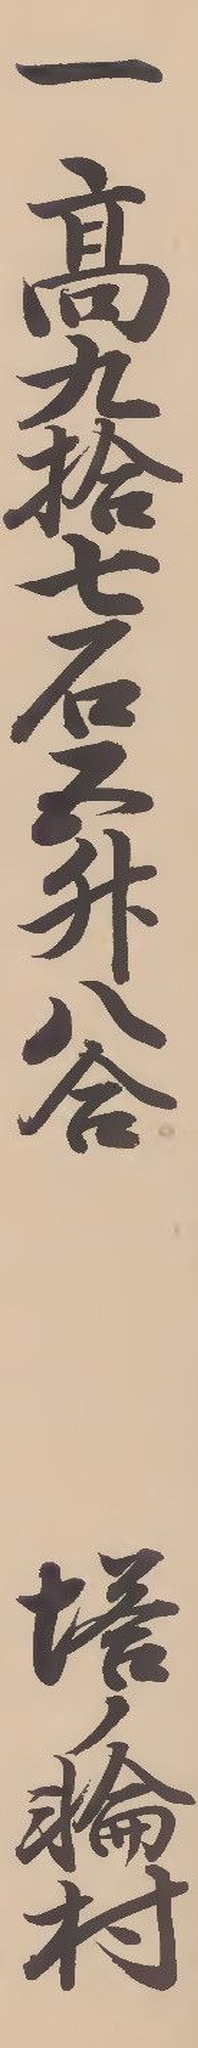一高九拾七石五升八合塔ノ輪村
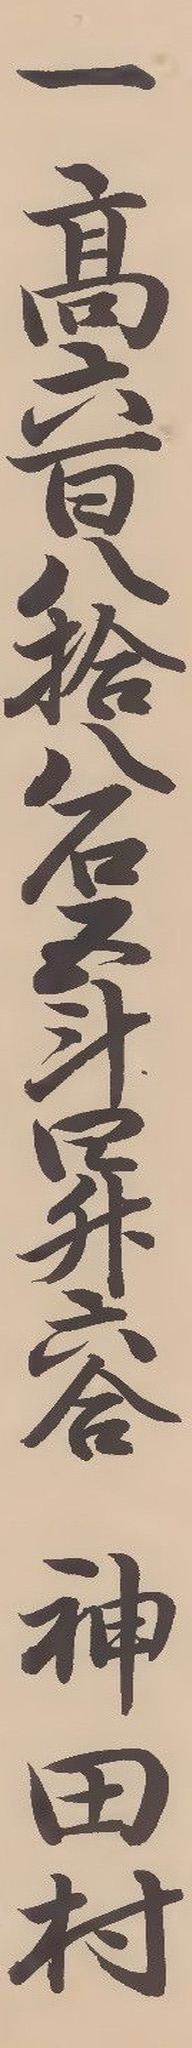一高六百八拾八石五斗四升六合神田村
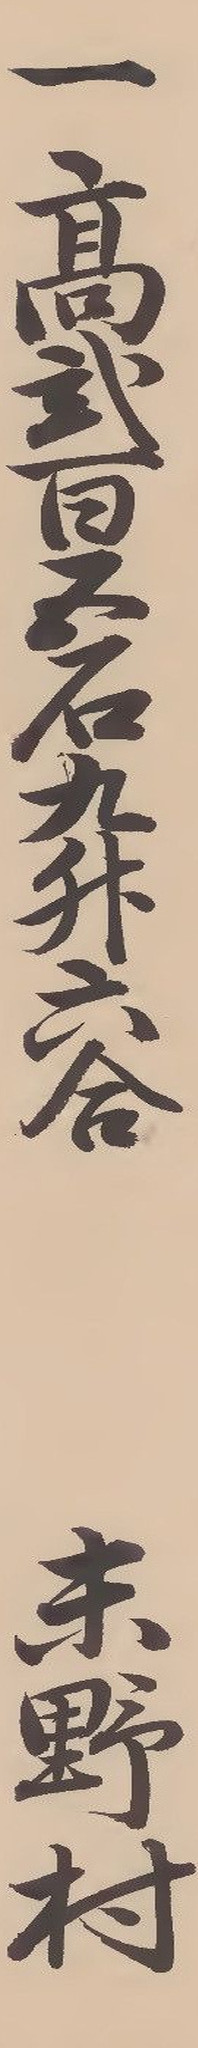一高弐百五石九升六合末野村
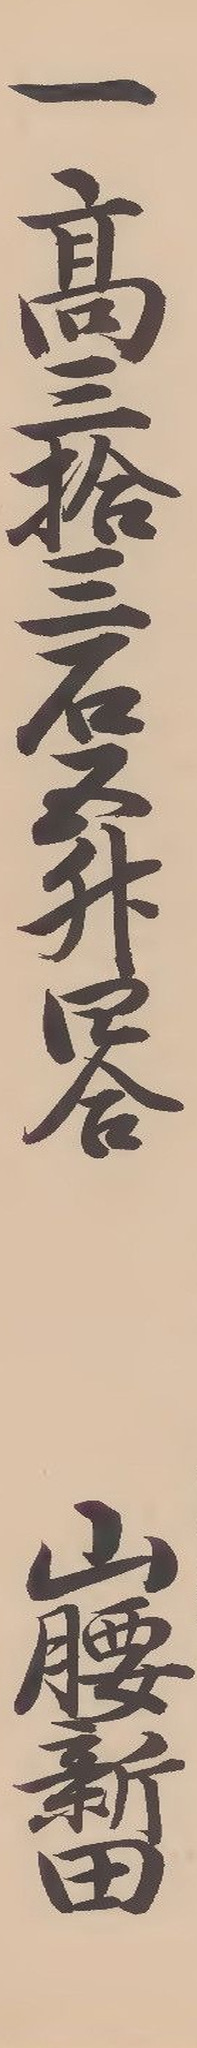一高三拾三石五升四合山腰新田

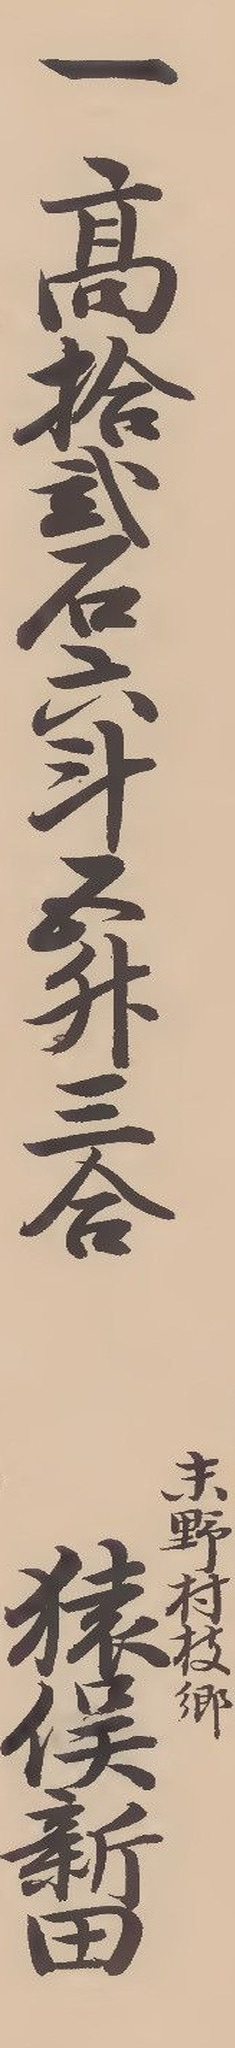一高拾弐石六斗五升三合猿俣新田
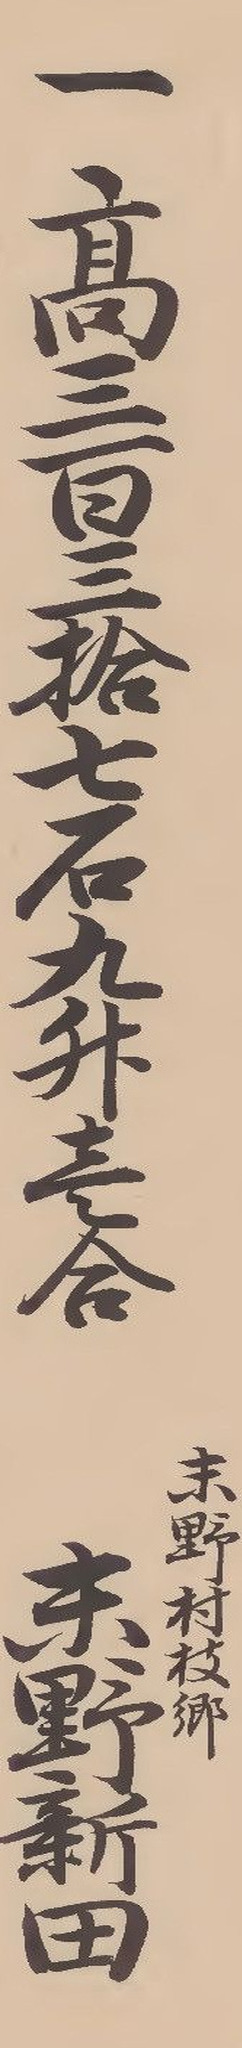一高三百三拾七石九升壱合末野新田
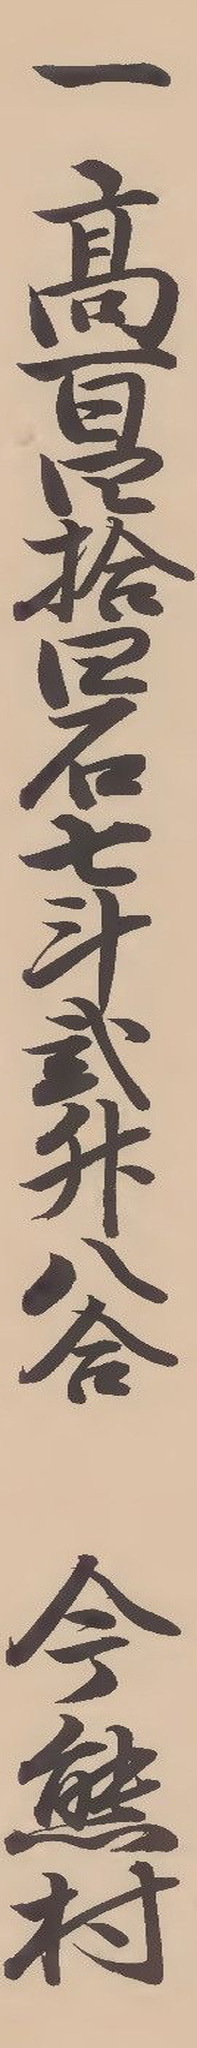一高百四拾四石七斗弐升八合今熊村
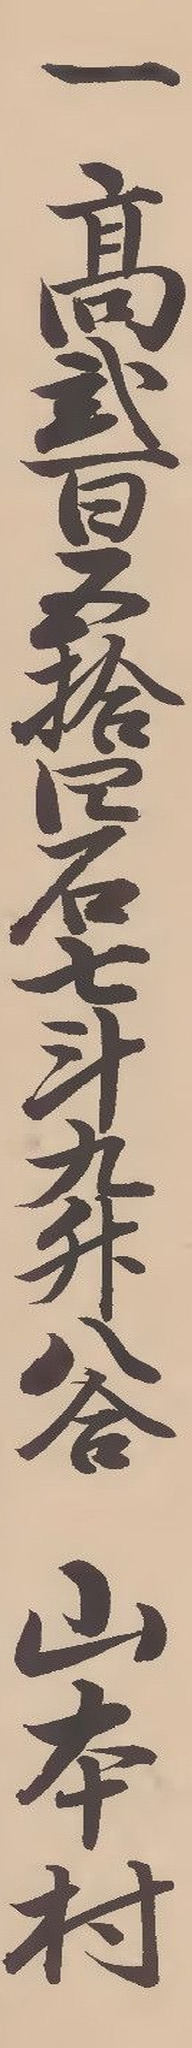一高弐百五拾四石七斗九升八合山本村
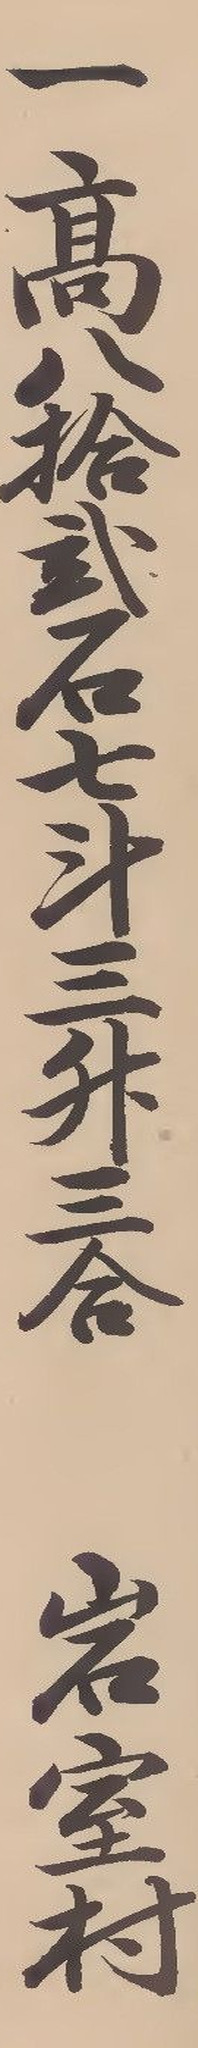一高八拾弐石七斗三升三合岩室村
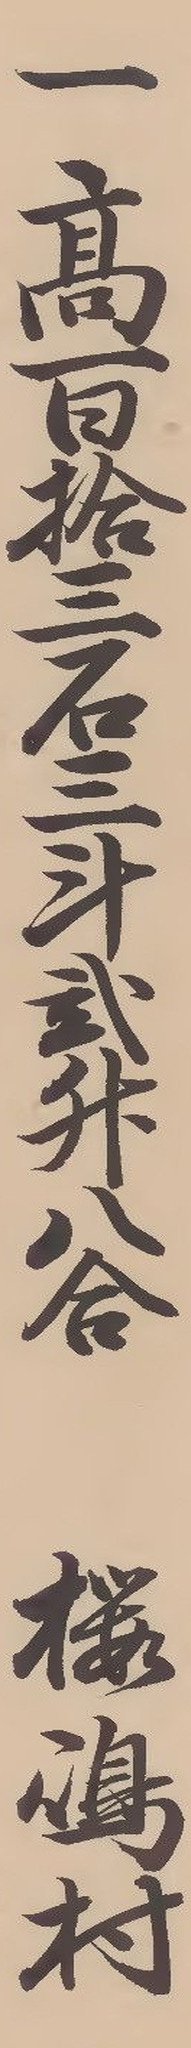一高百拾三石三斗弐升八合桜島村
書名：越後国郷帳　上
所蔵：国立公文書館 National Archives of Japan
